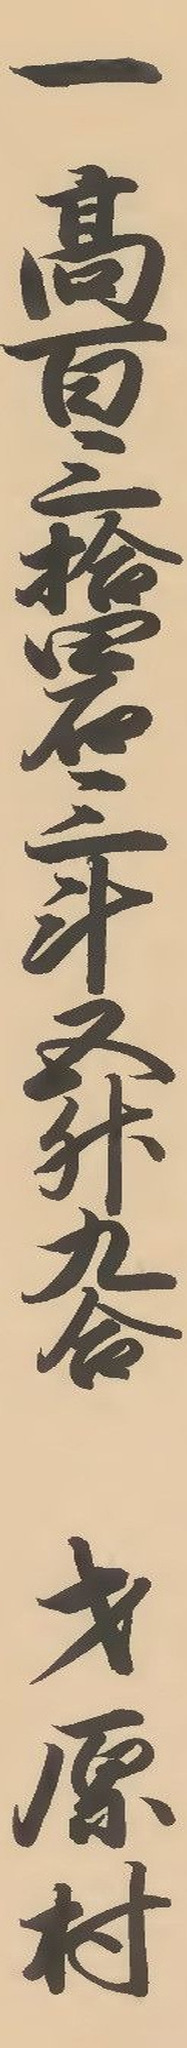一高百三拾四石三斗五升九合才原村
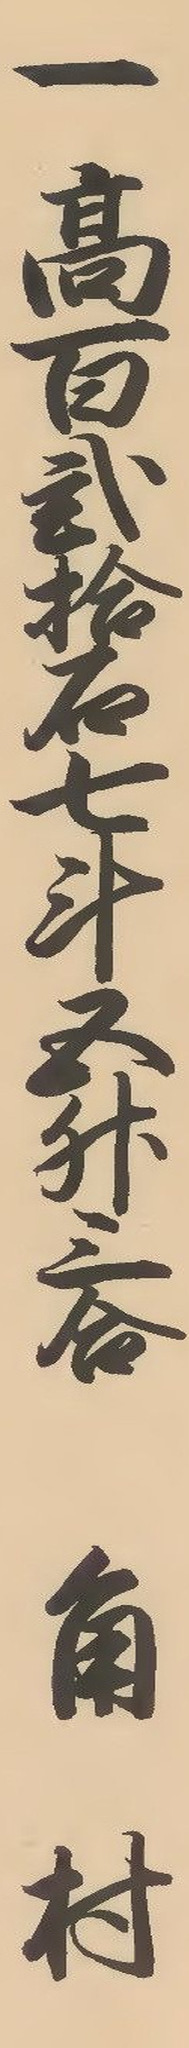一高百弐拾石七斗五升三合角村
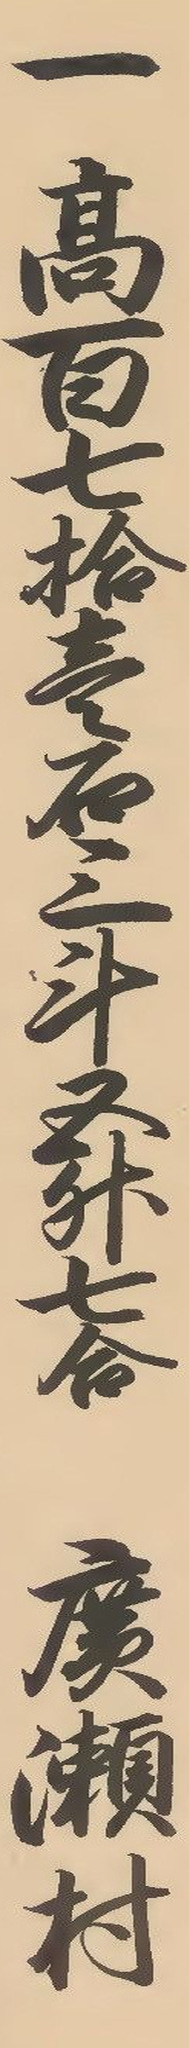一高百七拾壱石三斗五升七合広瀬村
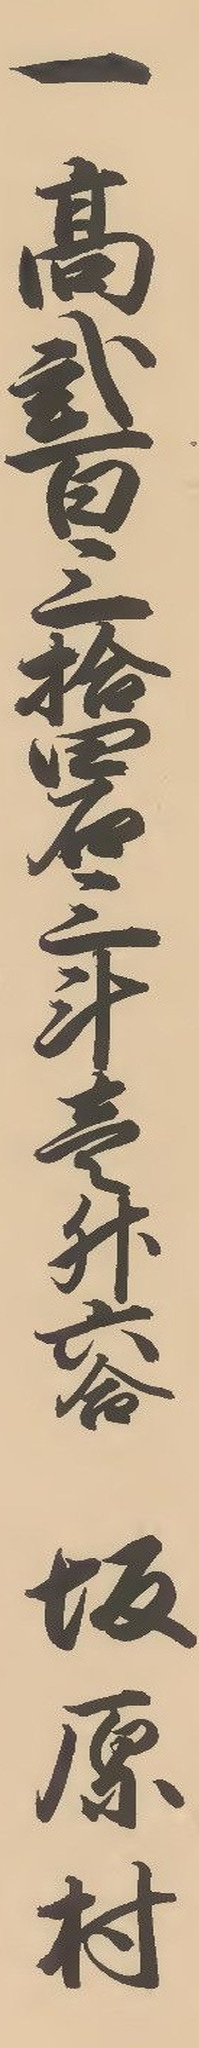一高弐百三拾四石三斗壱升六合坂原村
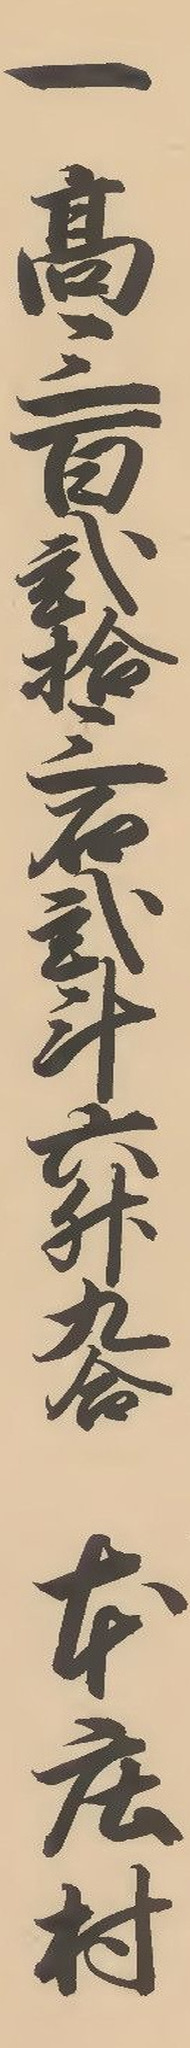一高三百弐拾三石弐斗六升九合本庄村
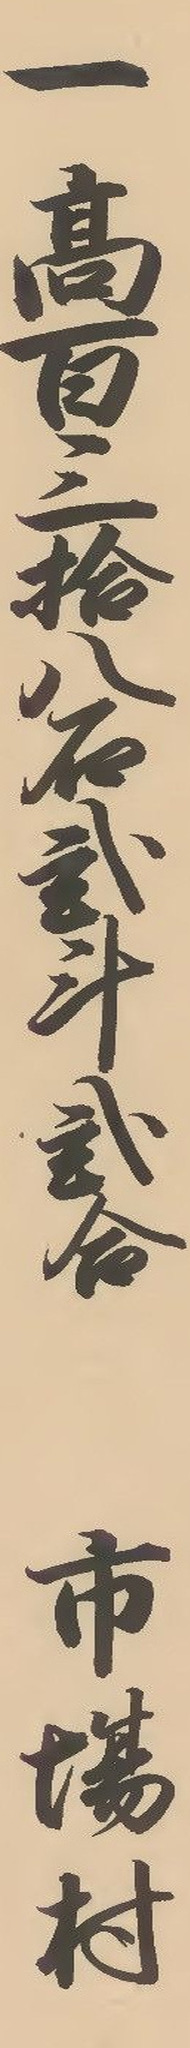一高百三拾八石弐斗弐合市場村

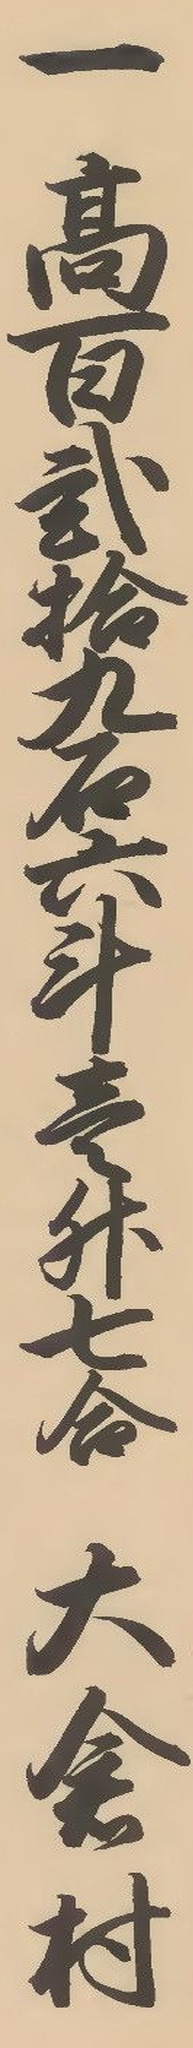一高百弐拾九石六斗壱升七合大倉村
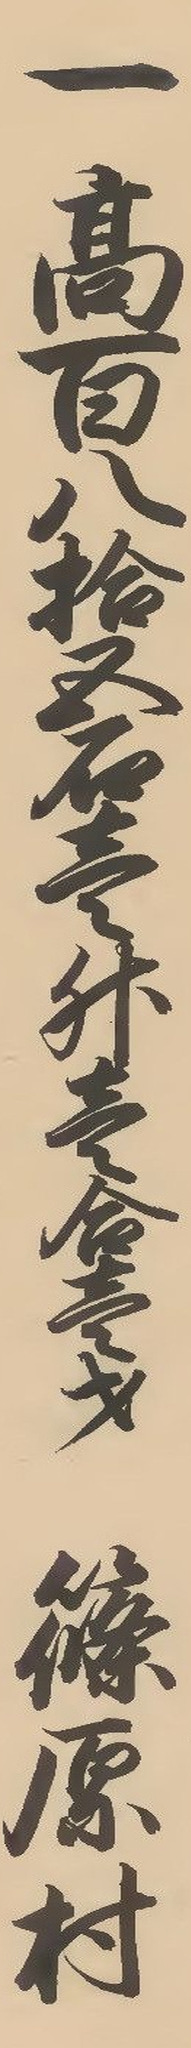一高百八拾五石壱升壱合壱才篠原村
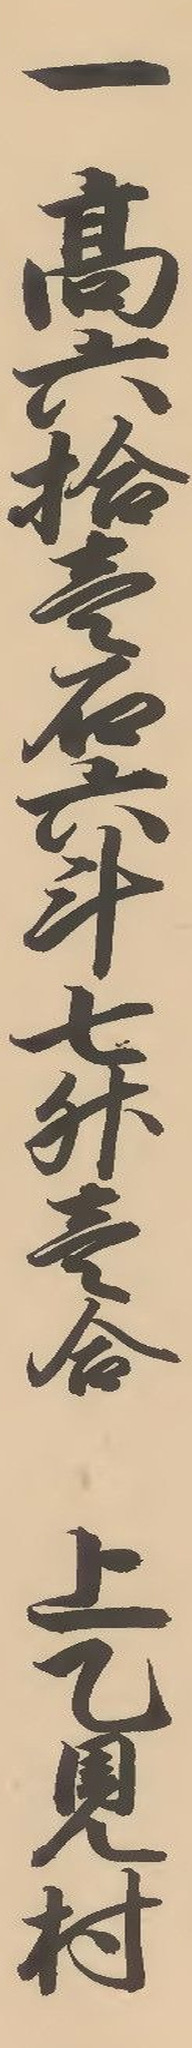一高六拾壱石六斗七升壱合上乙見村
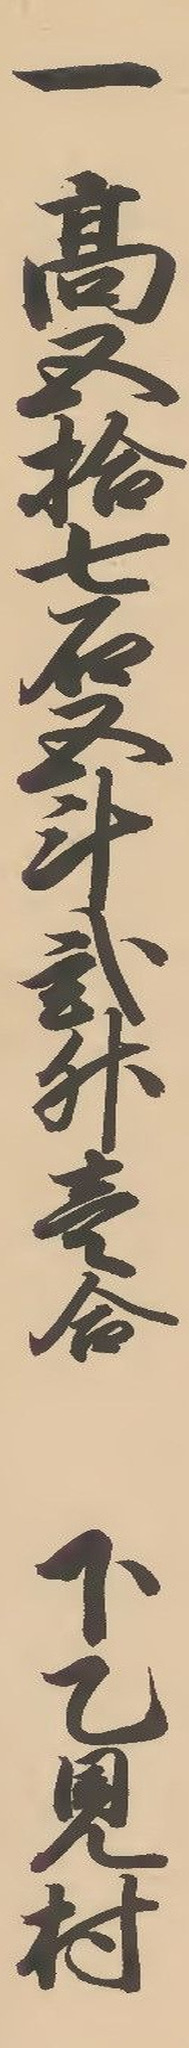一高五拾七石五斗弐升壱合下乙見村
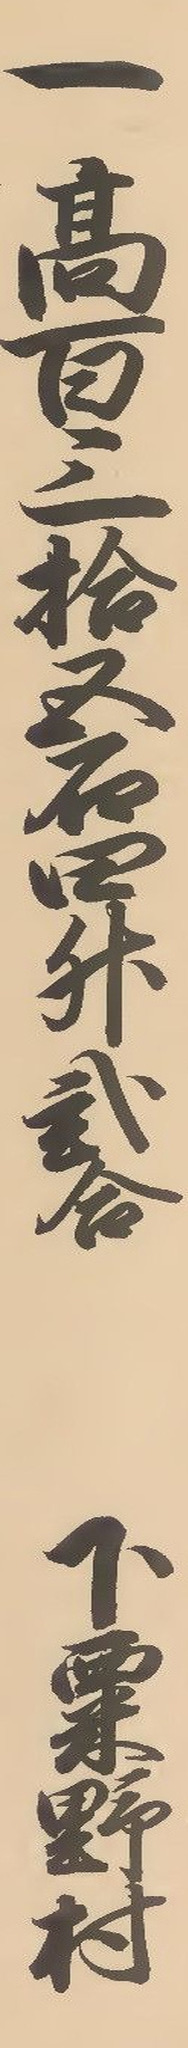一高百三拾五石四升弐合下粟野村
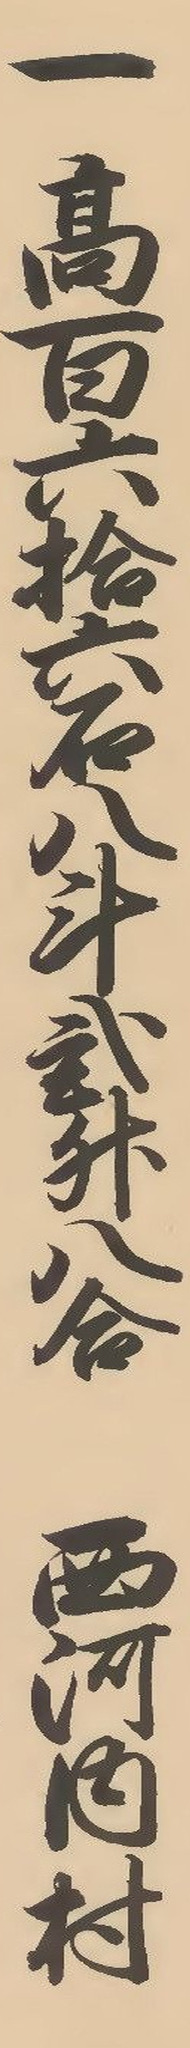一高百六拾六石八斗弐升八合西河内村
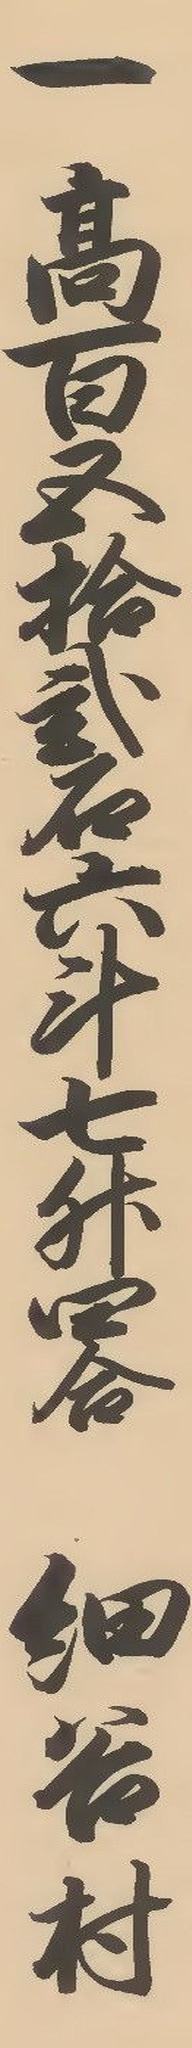一高百五拾弐石六斗七升四合細谷村
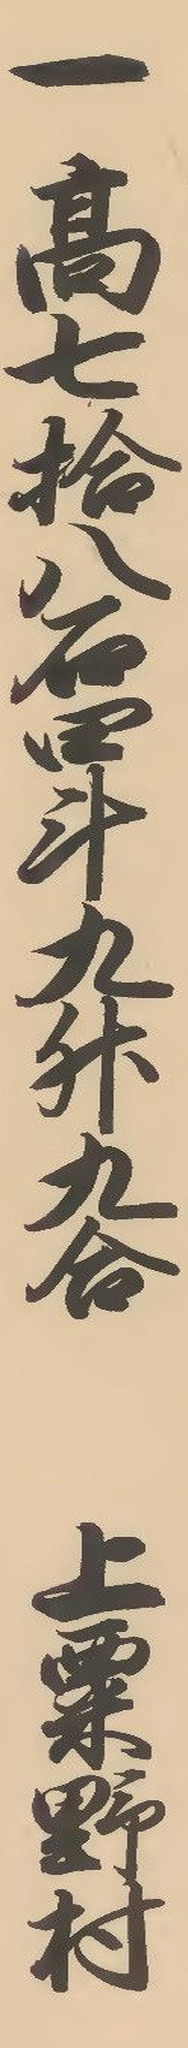一高七拾八石四斗九升九合上粟野村

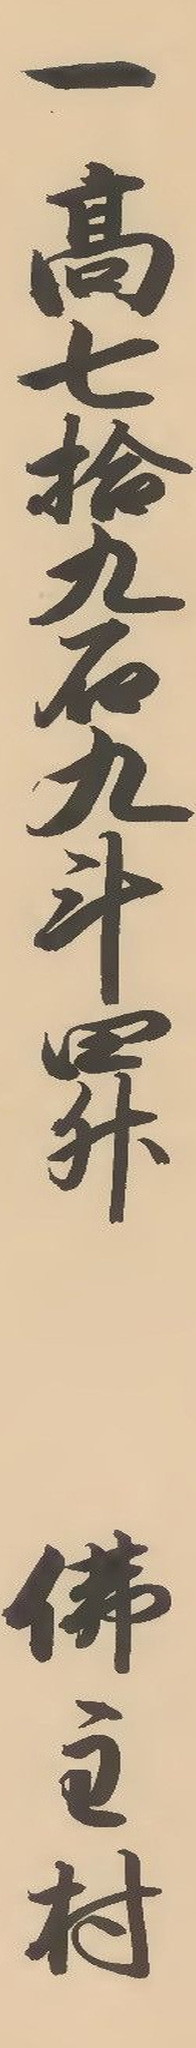一高七拾九石九斗四升仏主村
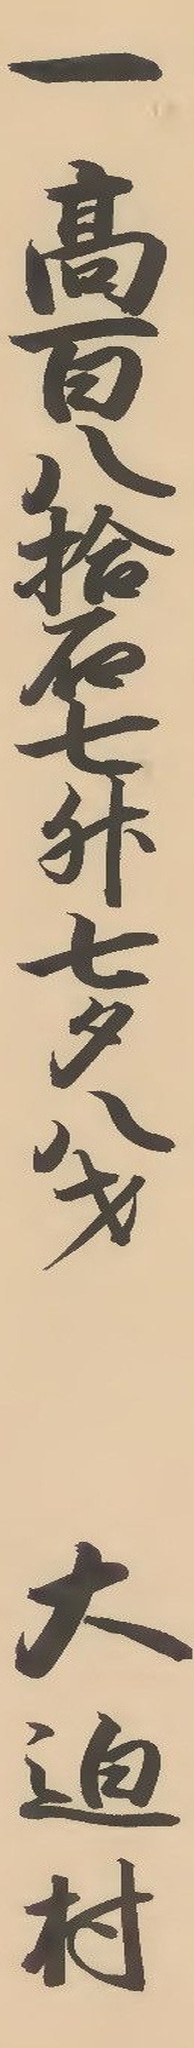一高百八拾石七升七勺八才大迫村
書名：丹波国郷帳
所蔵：国立公文書館 National Archives of Japan
